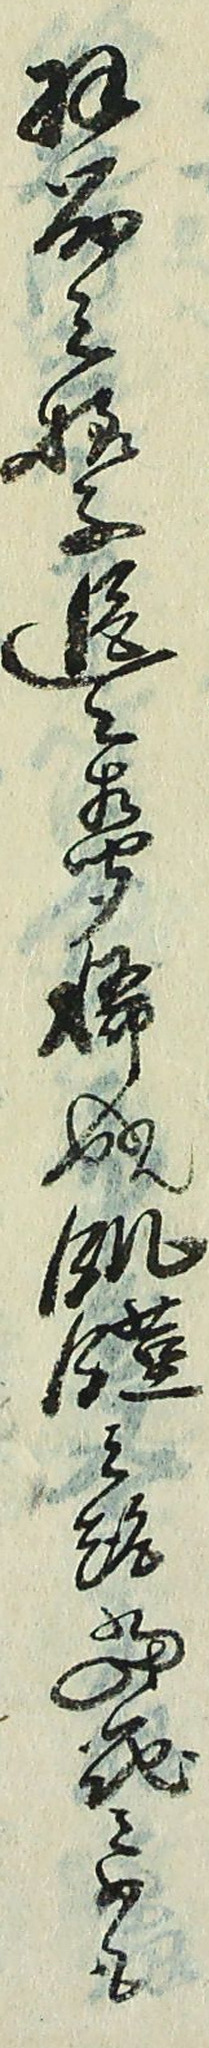羽筋之様子追々相聞稀成ル飢饉之趣当御地之義も
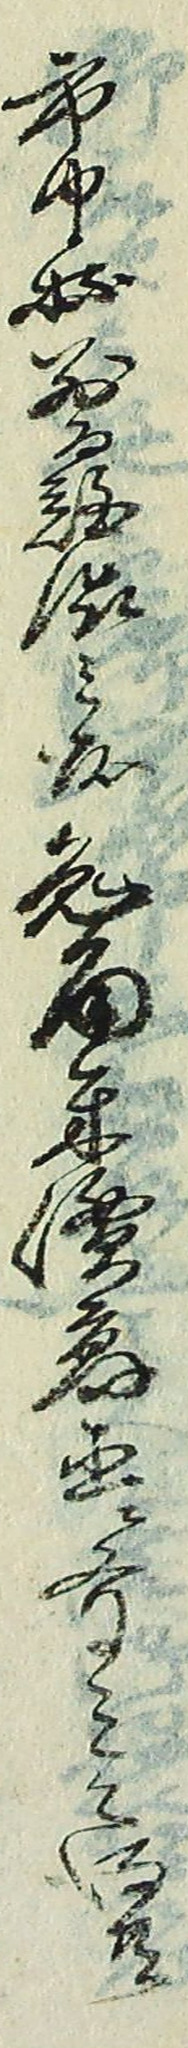市中等別而難渋之所兎角米價高直ニ有之候得共
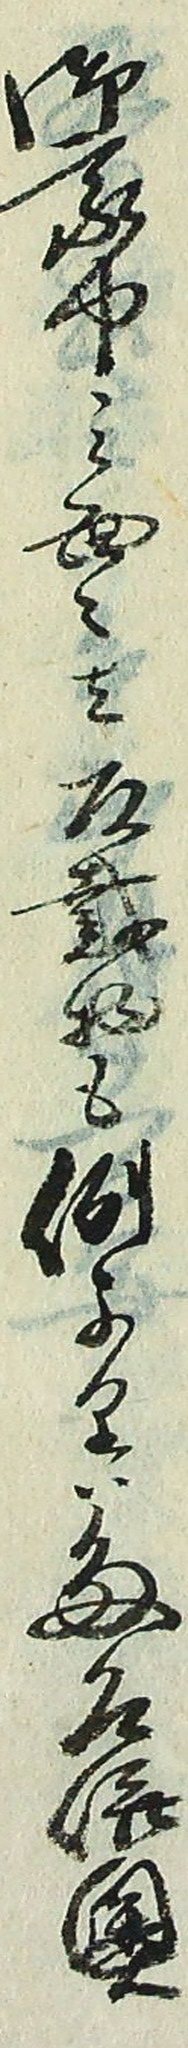御家中之面々者頂戴物も例よりハ多乍併奥
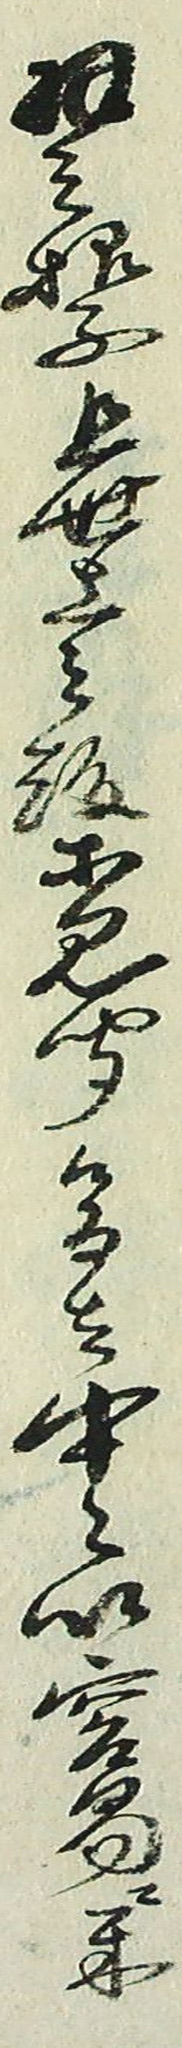羽之様子且世上之趣等見聞候而者中々以容易ニ米
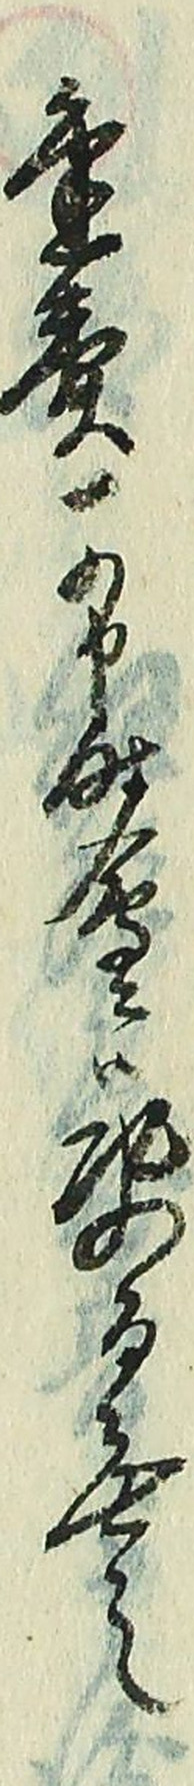金費可申時會ニハ決而無之
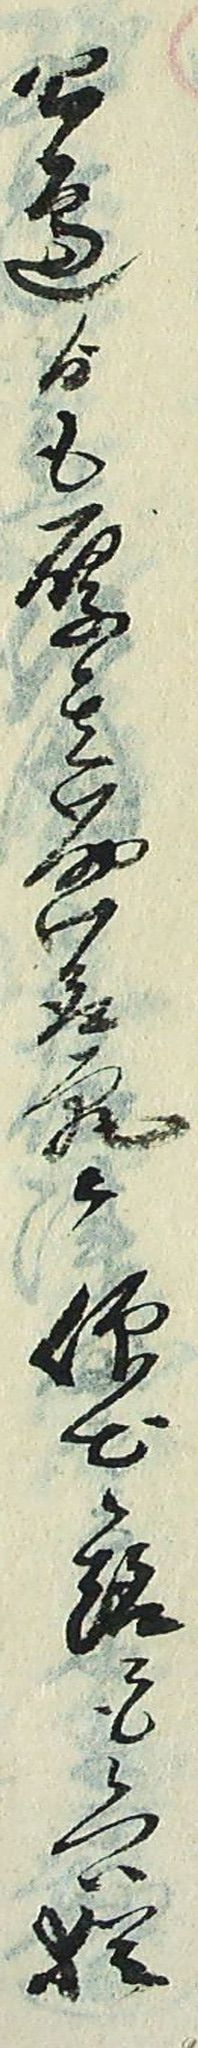公邊ゟも厚其筋御取究被仰出候趣ニも候へハ猶
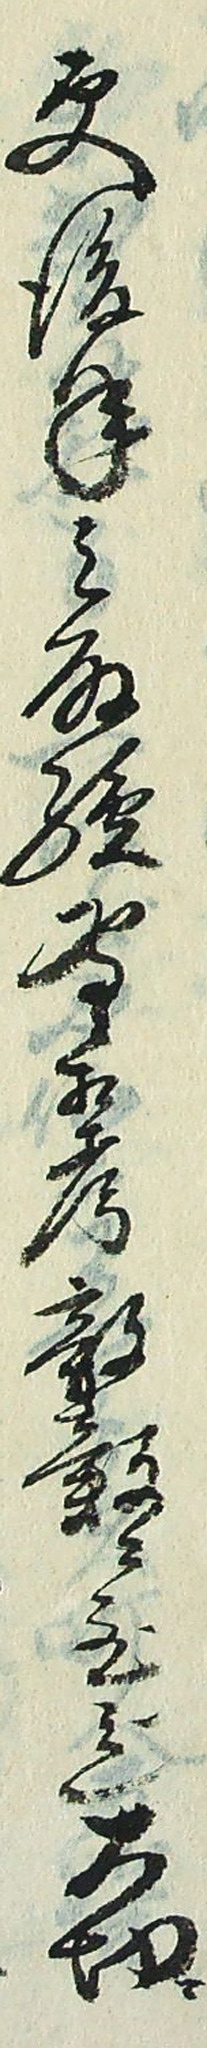更後年之取續専ニ相考新穀ニ至迄大切ニ
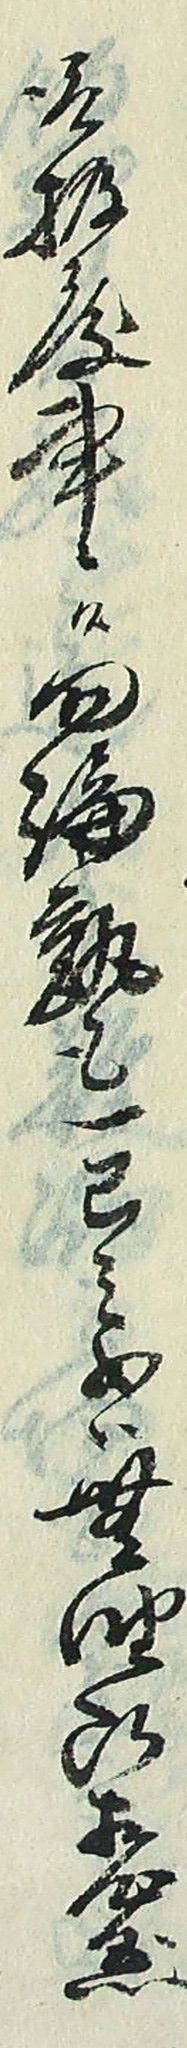取扱度事ニ候勿論孰も一己之義ハ無油断相心懸
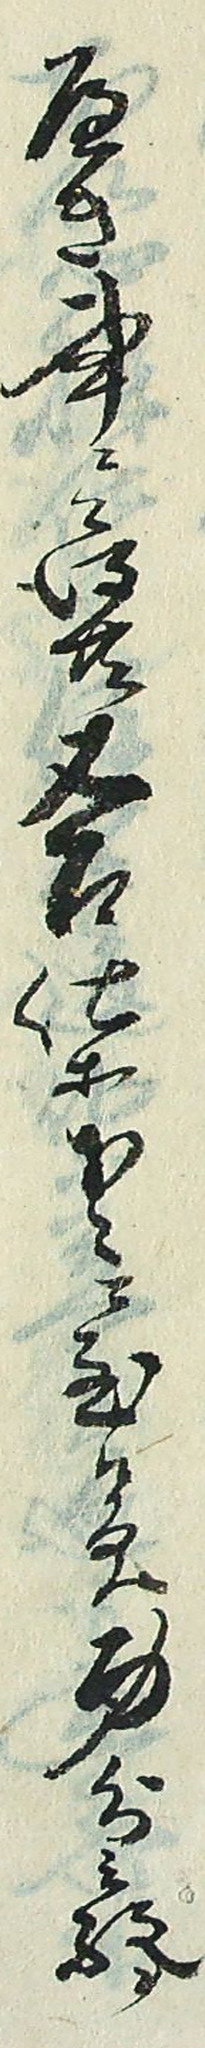へき事ニ候得共右召仕等下々ニ至候而ハ身分之程ヲ

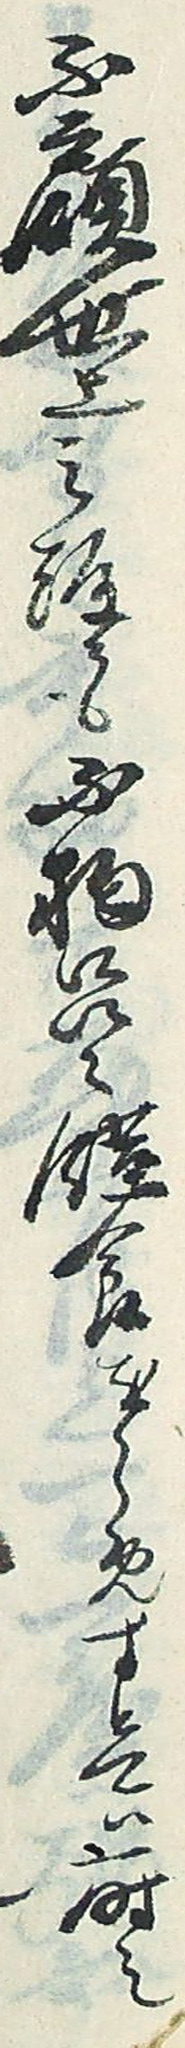不顧世上之趣ニも不拘只ニ飢食せしめすとてハ一時之
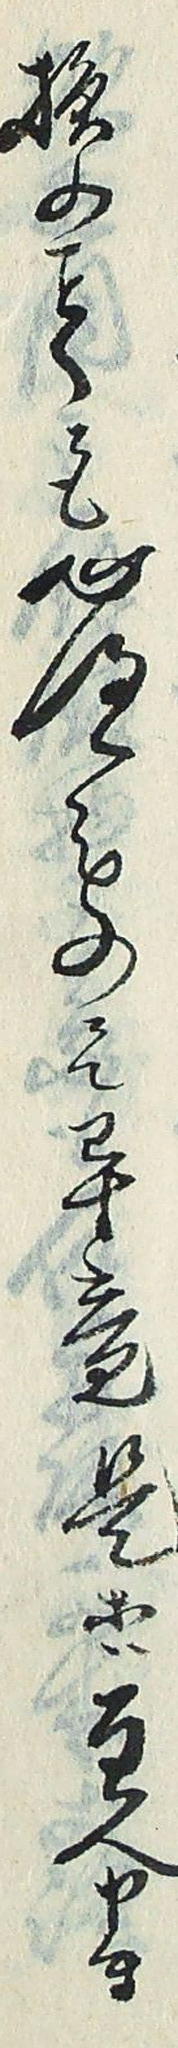損のことくとも心得候ものニて畢竟是等ハ主人申付
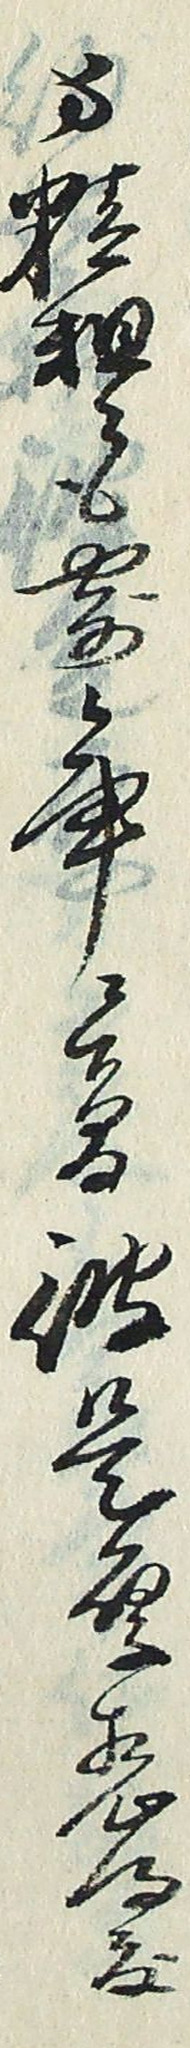方精粗ニも寄候事ニ候間彼是厚相心得度
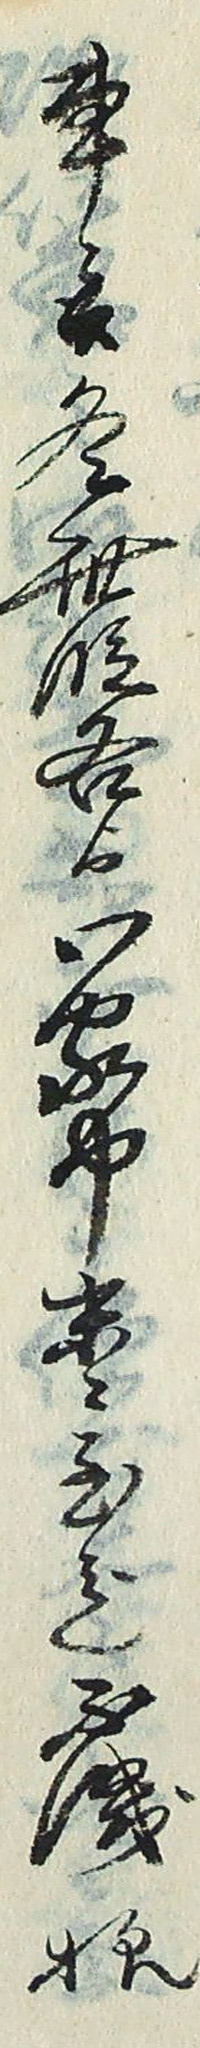事ニ候条此段各ゟ御家中末々至迄不洩様
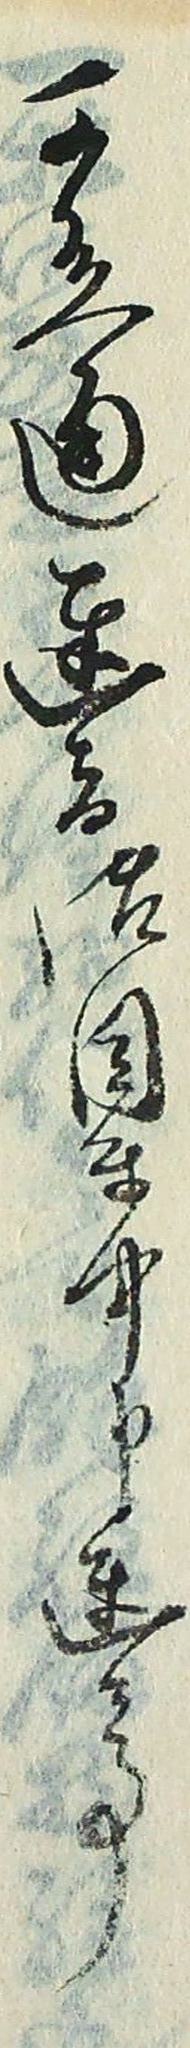可有通達旨御目付中申達候事
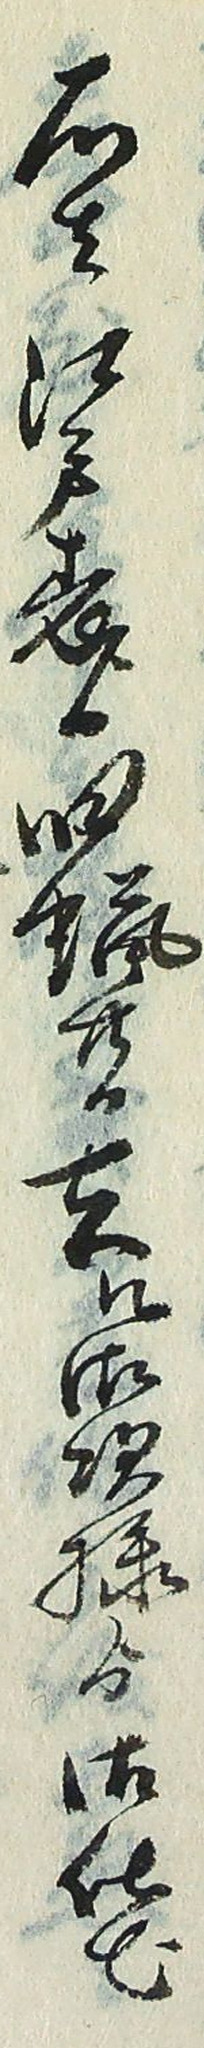右者江戸表ゟ旧臘廿日去ル御次様ゟ御仕出
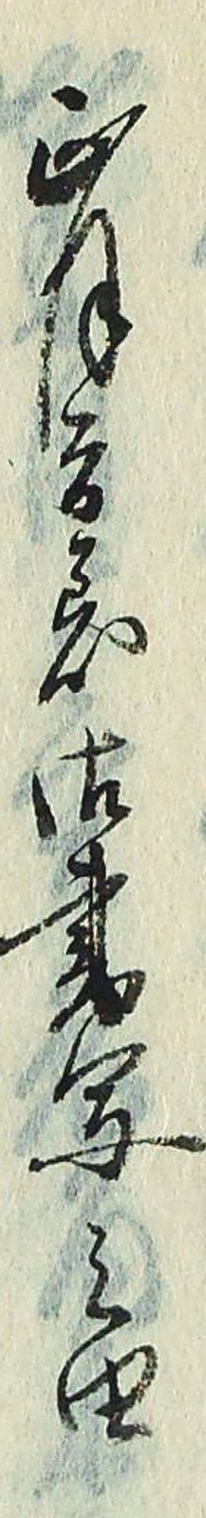正月二日着御書写之由
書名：諸御趣意書并御下知向之写
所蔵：鳴門教育大学 Naruto University of Education
